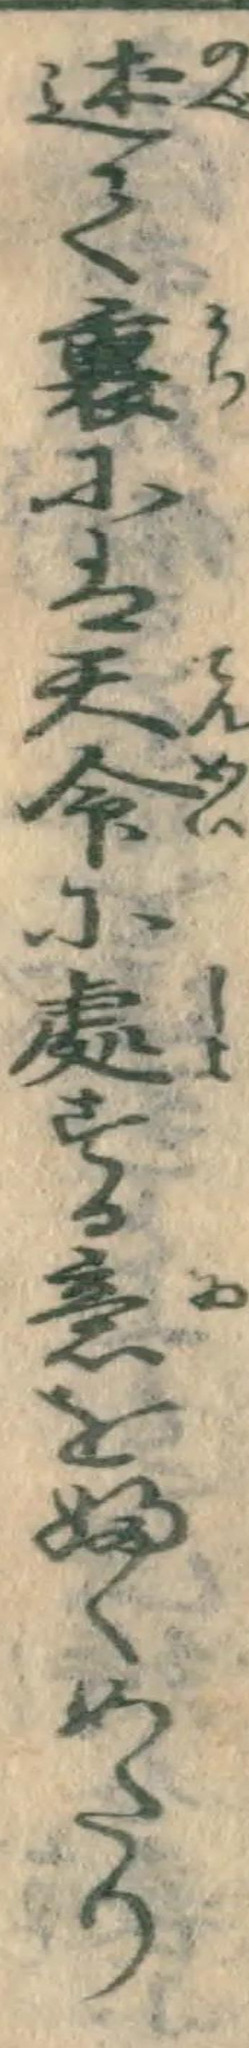述て裏には天命に処する意をふくめたり
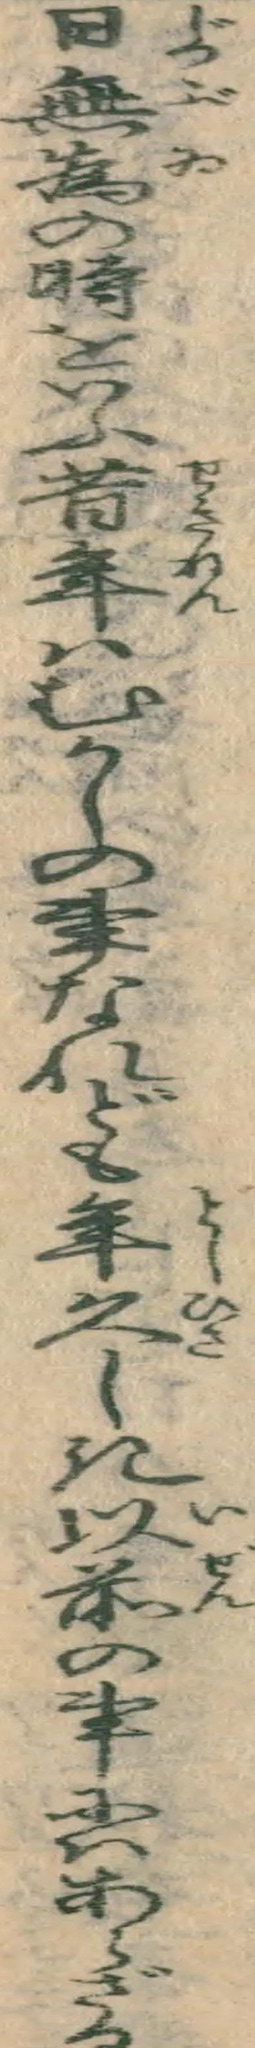日無為の時をいふ昔年はむかしの事なれども年久しき以前の事にはあらざる
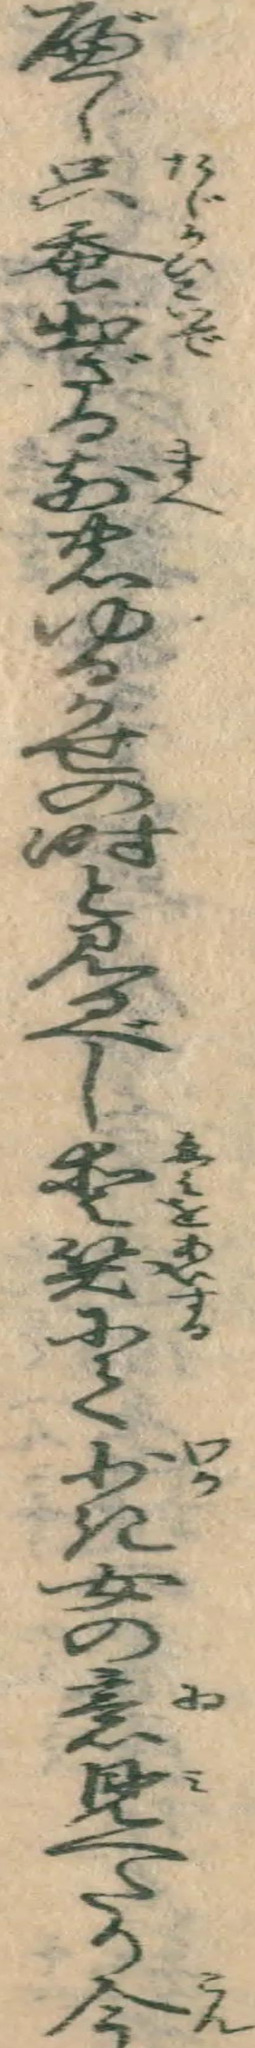べし只蚕出ざる前のゆるかせの時と見るべし愛笑にて少き女の意見へたり今
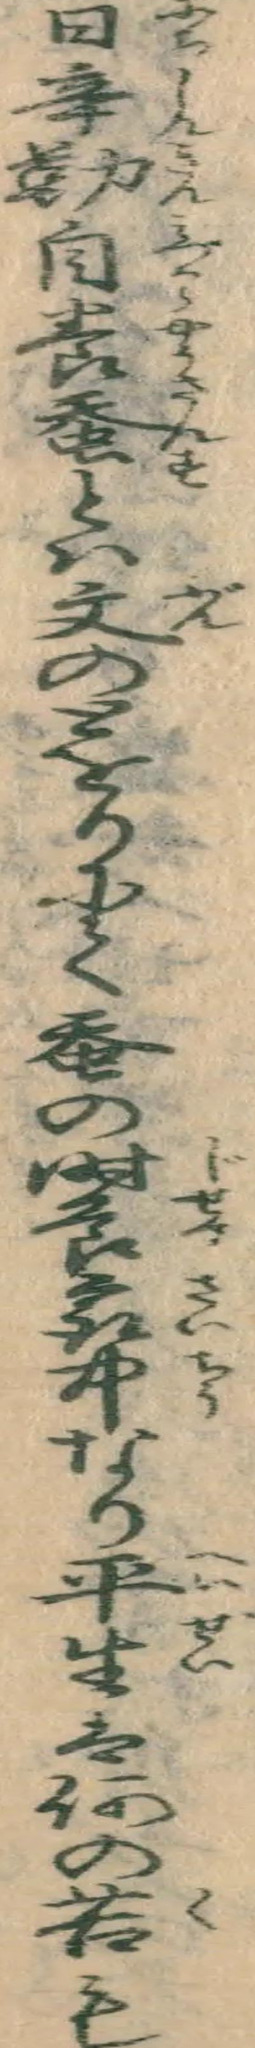日辛勤自養蚕とは文のとをりにて蚕の時節最中なり平生は何の苦も
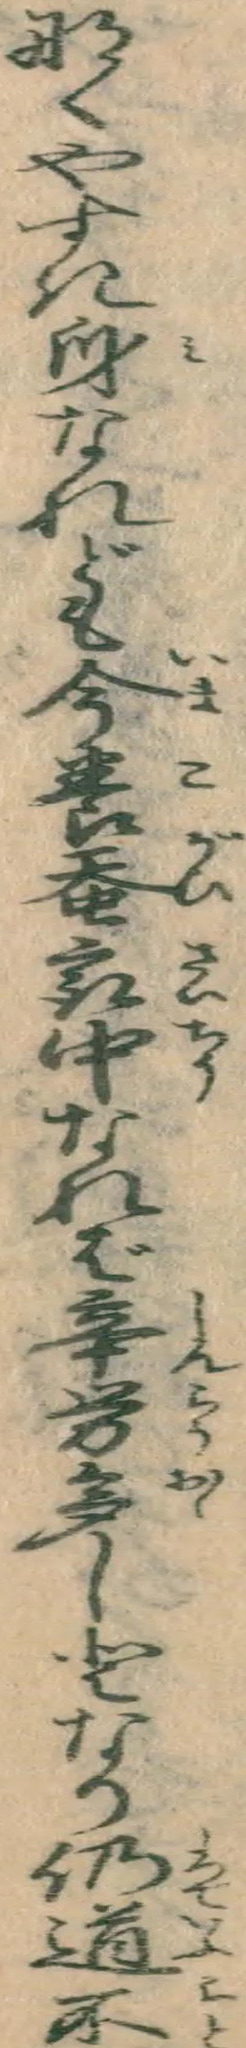なくやすき身なれども今養蚕最中なれば辛労多しとなり仍道不
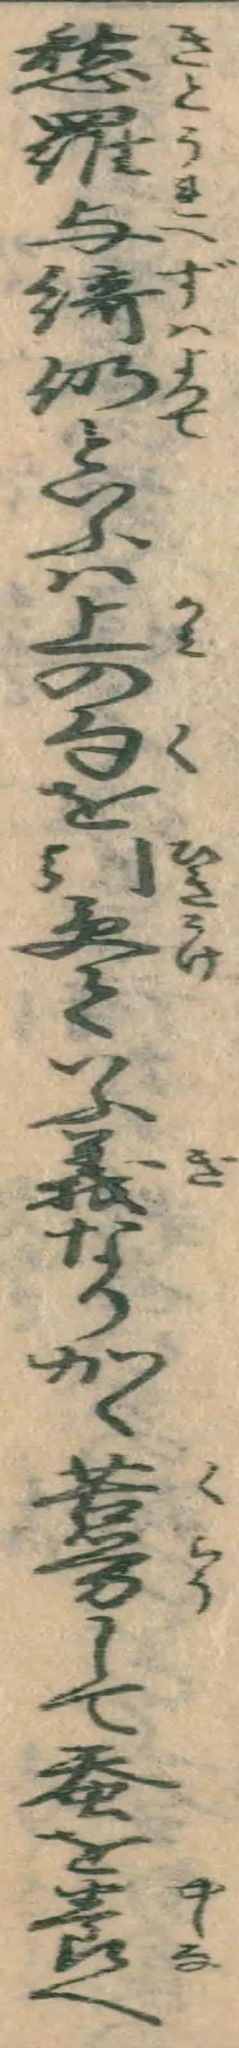愁羅与綺仍といふは上の句を引受ていふ義なりかく苦労して蚕を養へ
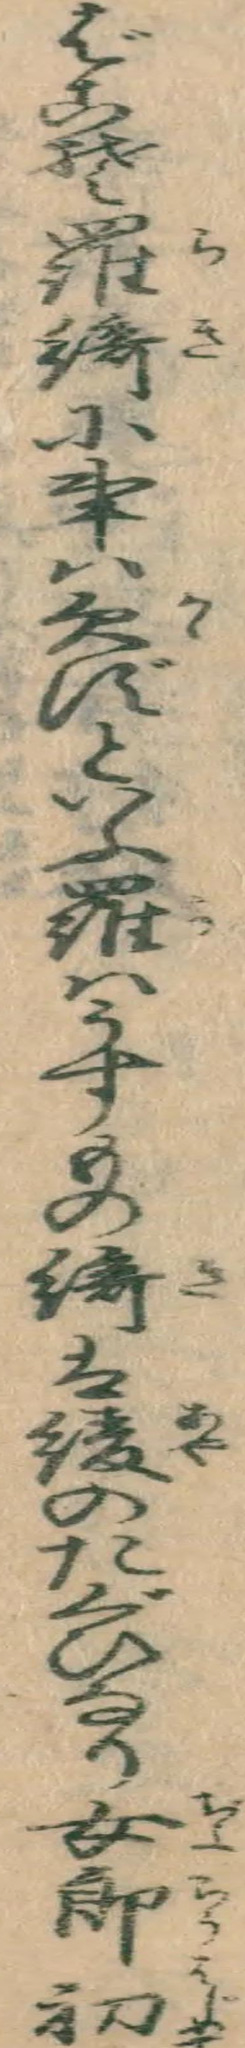ばこそ羅綺に事は欠ずといふ羅はうすもの綺は綾のたぐひなり女郎初
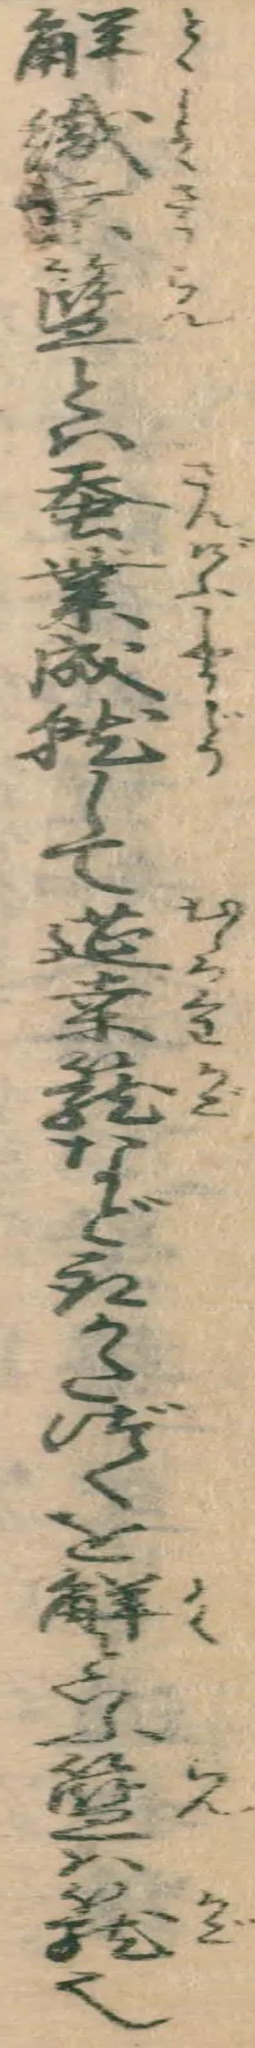解織桑籃とは蚕業成就して莚桑籠など取かたづくを解といふ籃は籠也
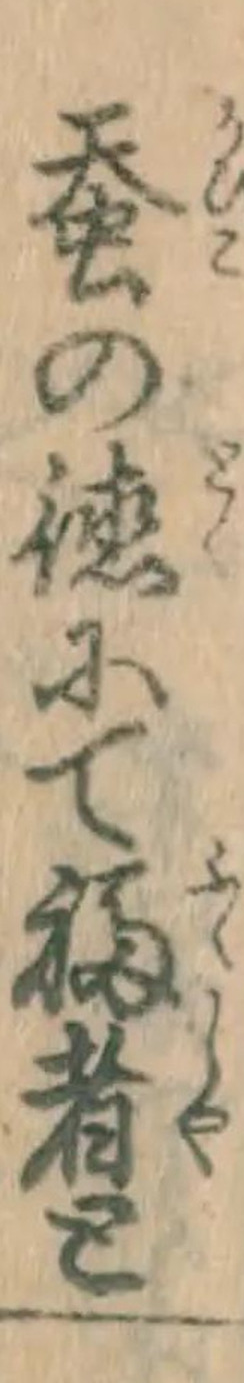蚕の徳にて福者と
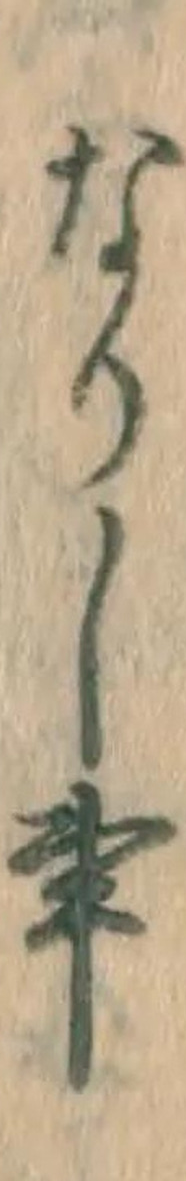なりし事
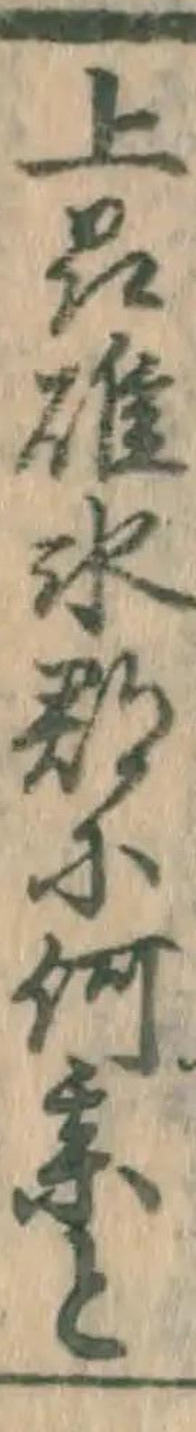上州碓氷郡に何某と
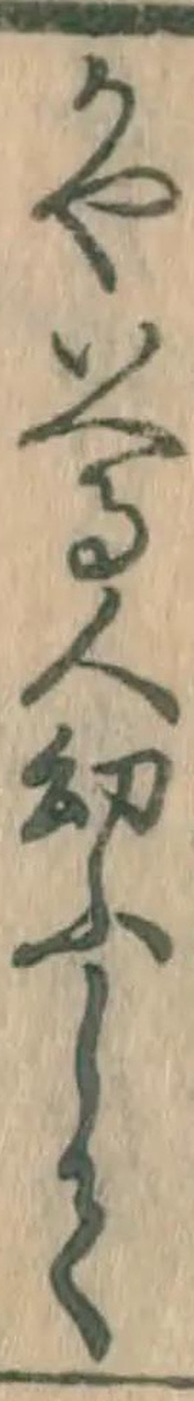かやいへる人幼ふして
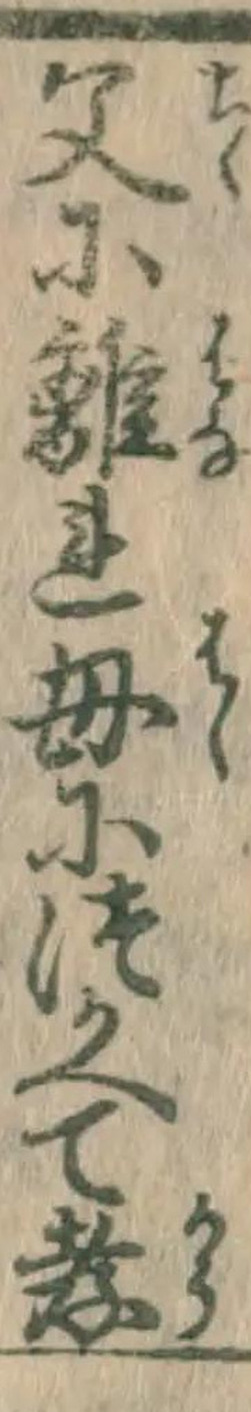父に離れ母につかへて孝
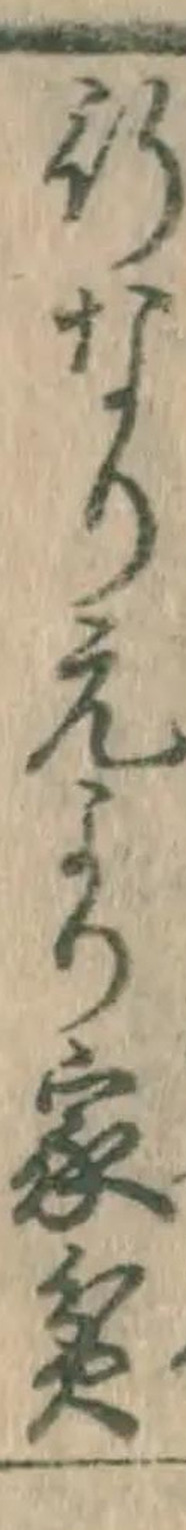行なり元より家貧
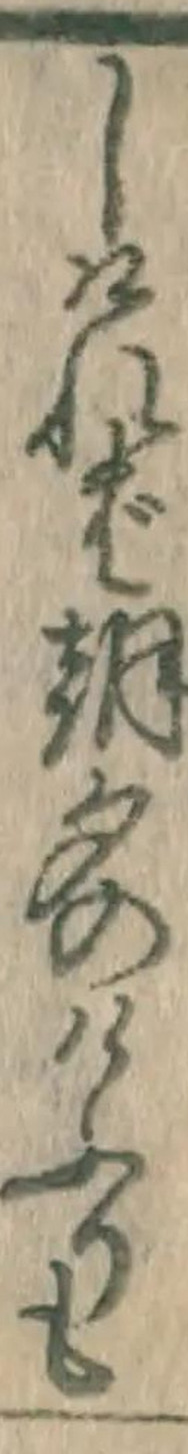しければ朝夕のけふりも
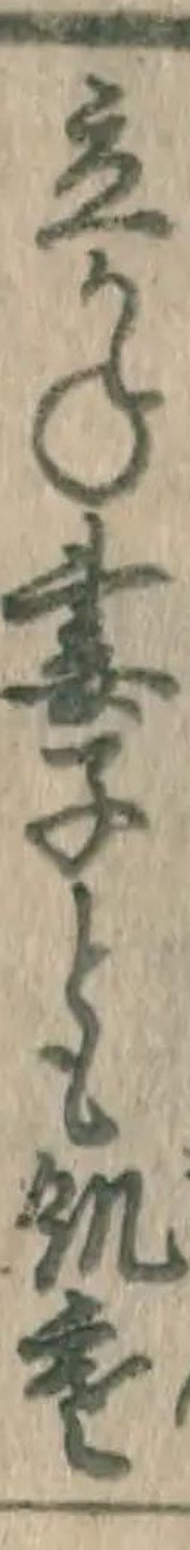立かね妻子とも飢寒
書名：養蚕秘録 3巻. [3]
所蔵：国立国会図書館 National Diet Library, JAPAN
